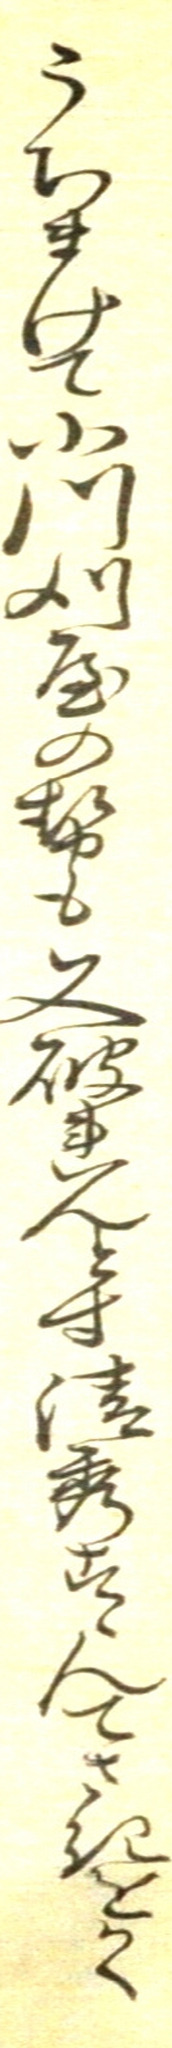うちまけて小川刈屋の勢も又破れんとす清秀すゝんてさきをかく
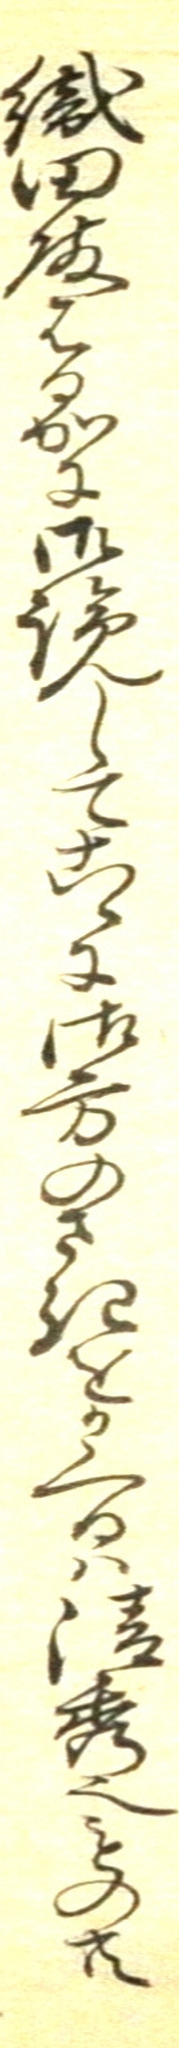織田殿はるかに御覧してこゝに御方のさきをかくるは清秀也もの共
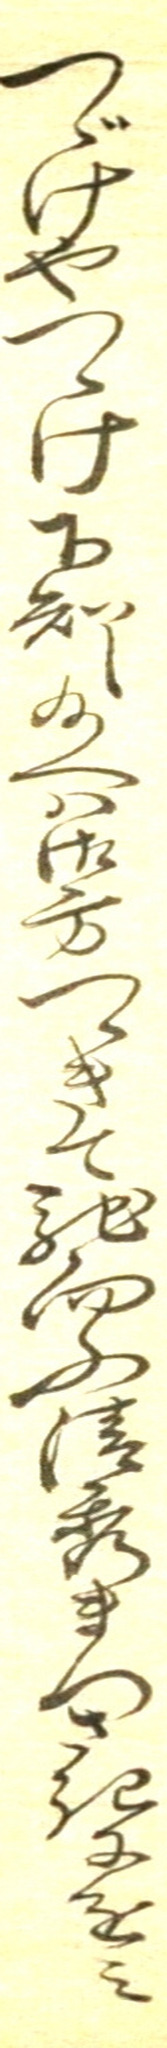つゞけやつゝけ下知し給へは御方つゝきて馳向ふ清秀まつさきに進み
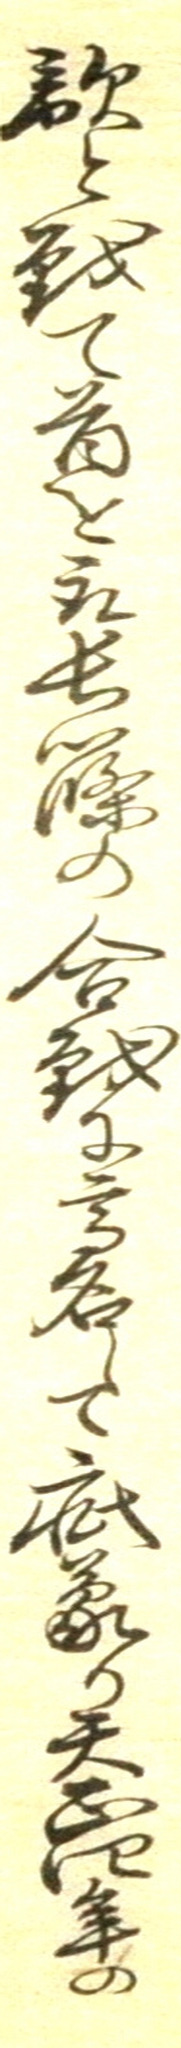敵と戦て首を取長篠の合戦に高名して疵蒙り天正四年の
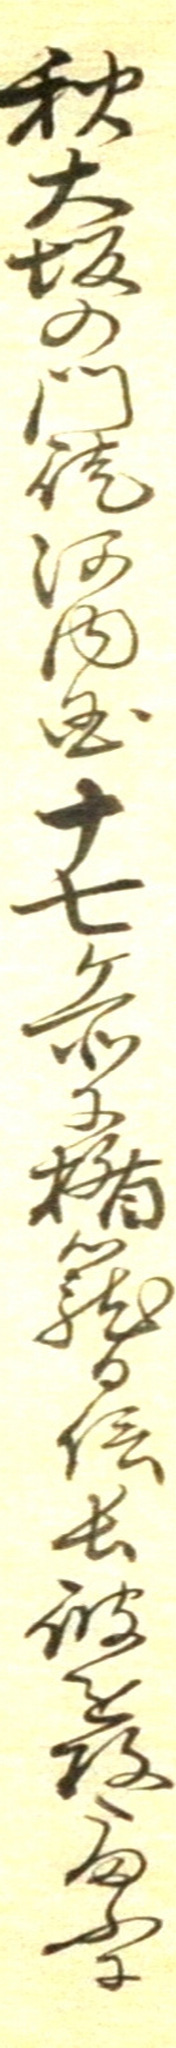秋大坂の門徒河内国十七ヶ所に楯籠る信長彼を攻たまふに
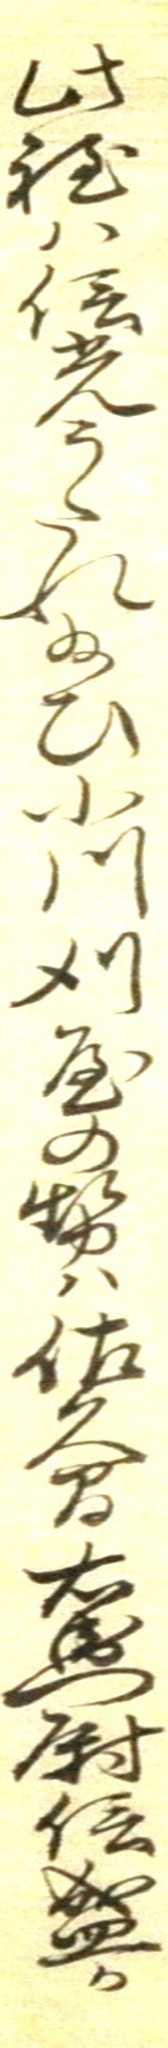此程は信光うたれ給ひ小川刈屋の勢は佐久間右衛門尉信盛か
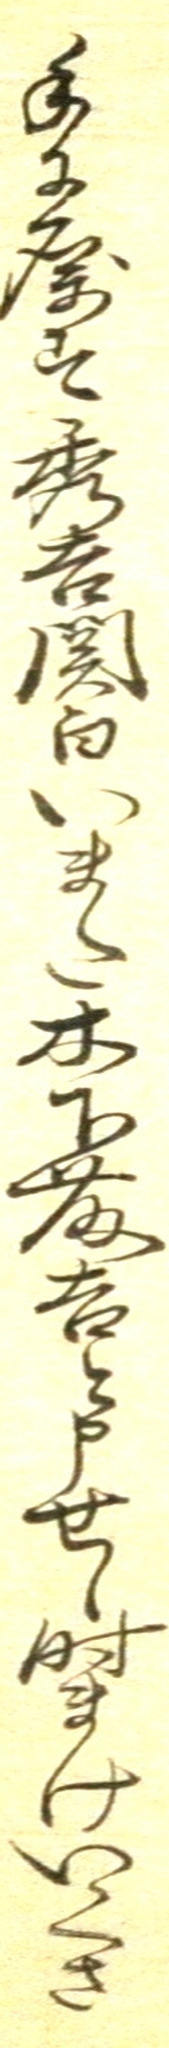手に属す秀吉関白いまた木下藤吉と申せし時まけいくさ
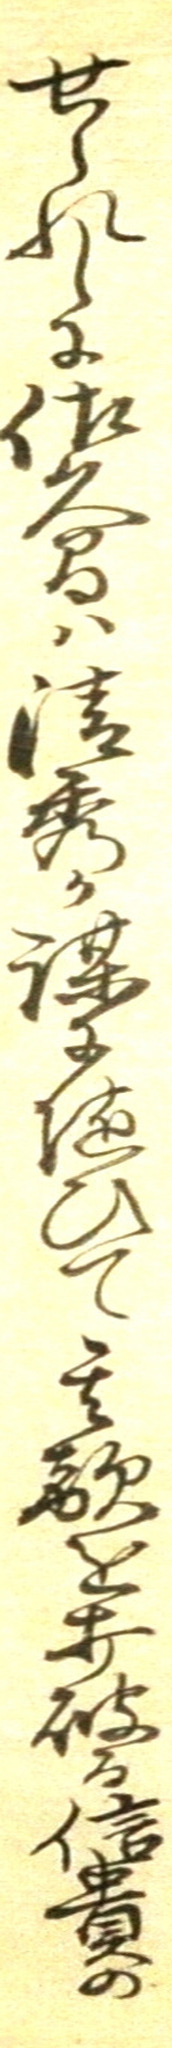せられしに佐久間は清秀か謀に随ひて其敵を打破る信貴の
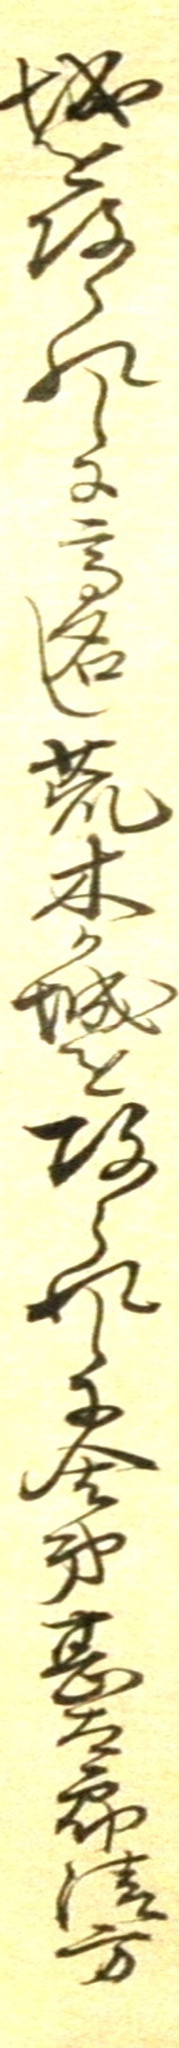城を攻られしに高名し荒木か城を攻られしに舎弟甚太郎清方
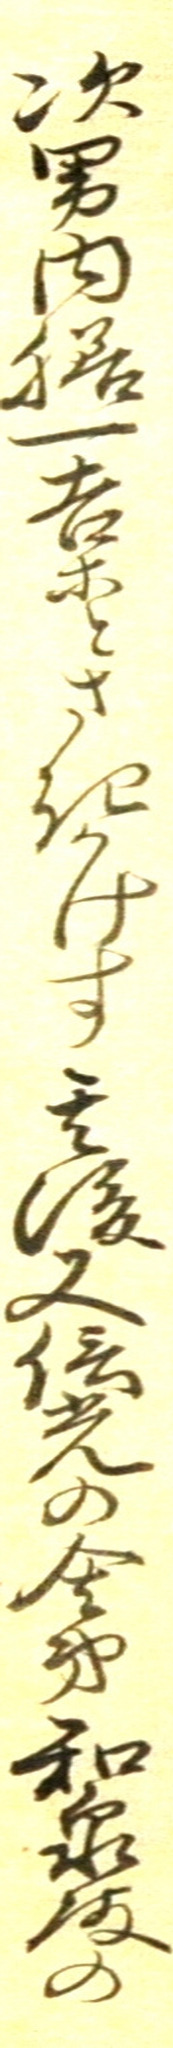次男内膳一吉等とさきかけす其後又信光の舎弟和泉殿の

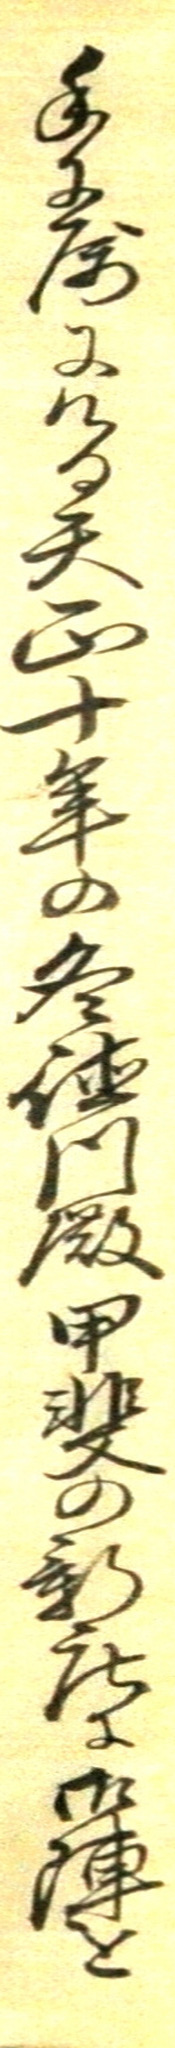手に属にける天正十年の冬徳川殿甲斐の新庄に御陣を
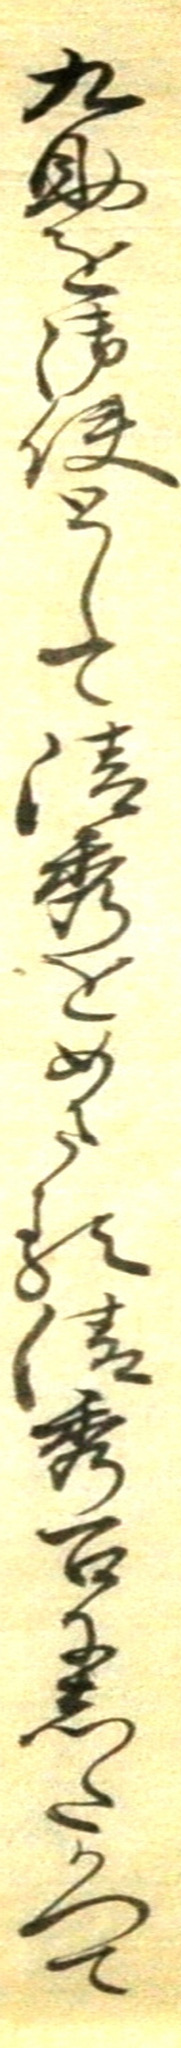九助を御使として清秀をめさる清秀召にしたかつて
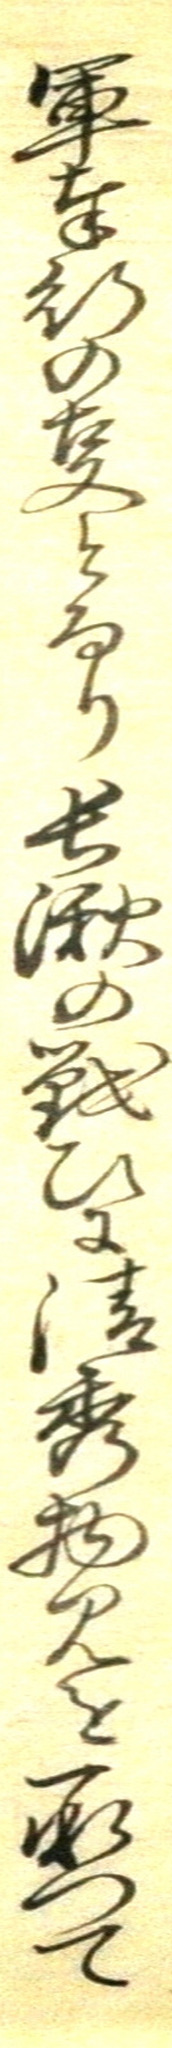軍奉行の事となり長湫の戦ひに清秀物見を承つて
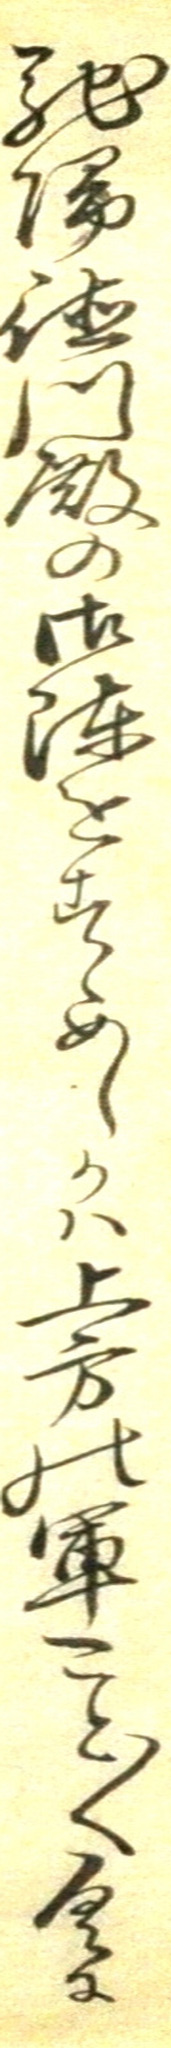馳帰徳川殿の御陣をすゝめしかは上方の軍こと〳〵くに
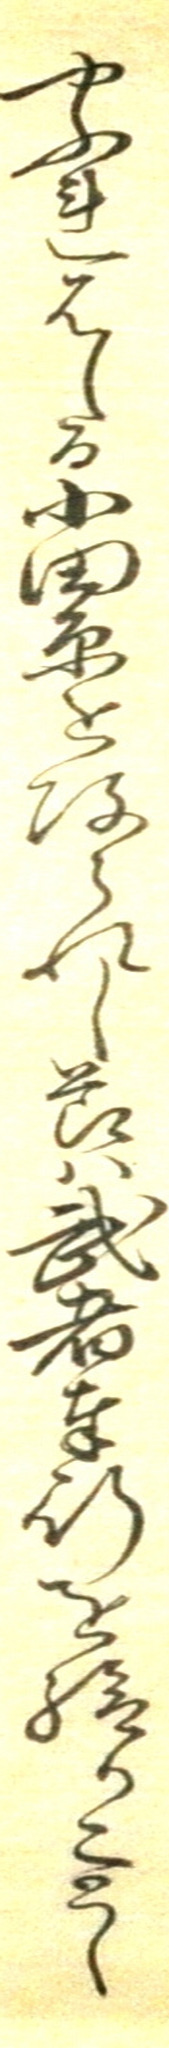やふれはしる小田原を攻られし節は武者奉行を給りことし
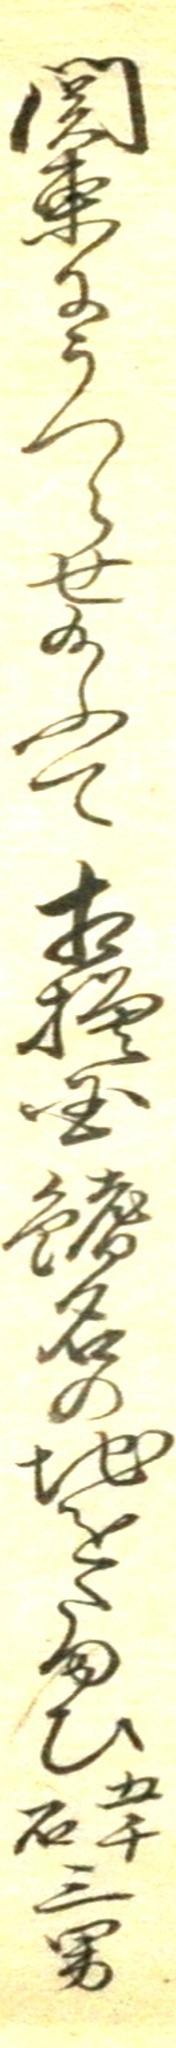関東にうつらせ給ふて相模国鰭名の地をたまひ五千石三男
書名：藩翰譜（四・下）
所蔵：伊那市立高遠町図書館・合同会社AMANE
